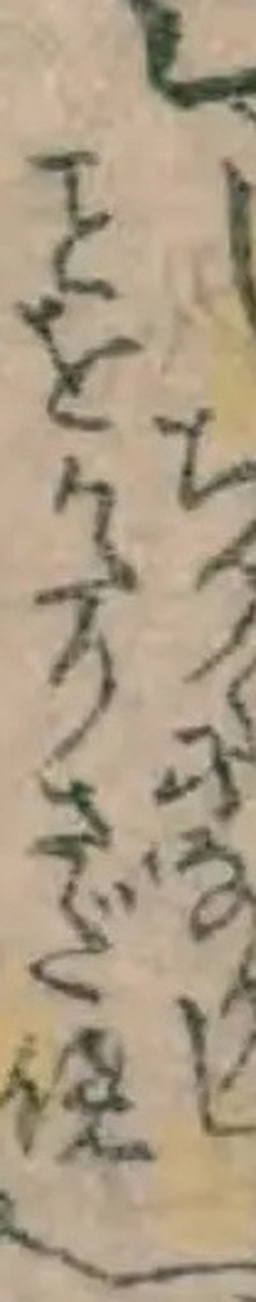ことをかたりさだ
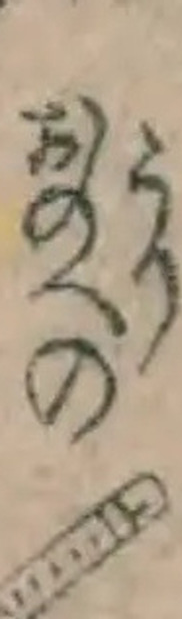おのへの
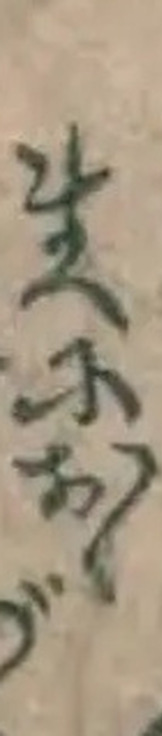まへにおく
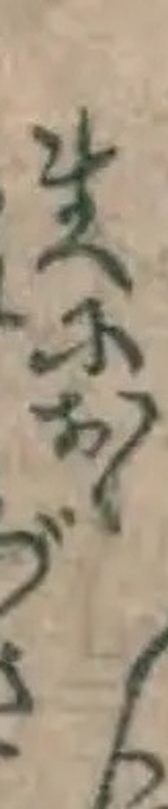まへにおく
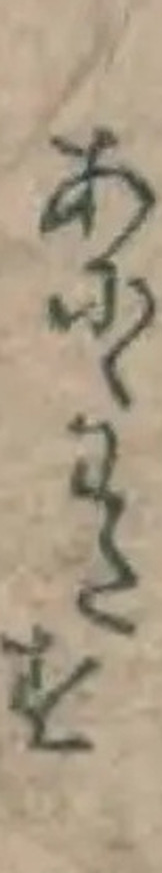あにゝわたす

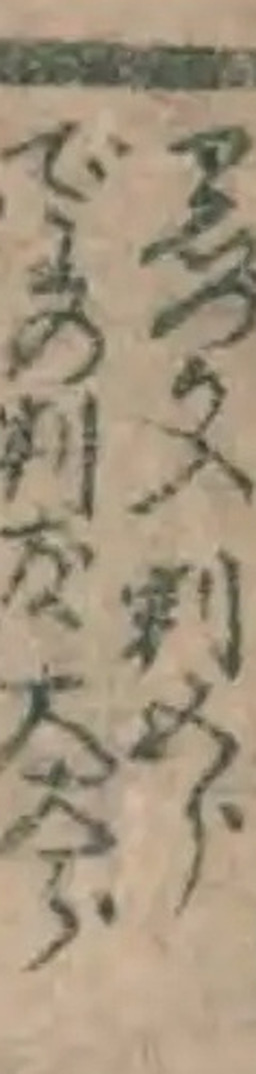でわの判官大太郎
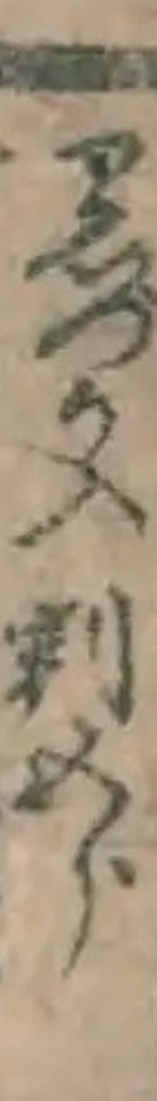黒づか入五郎
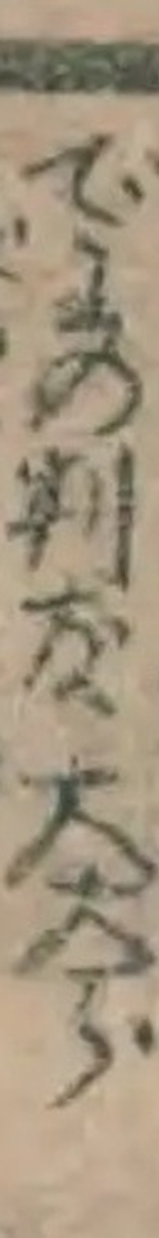でわの判官大太郎
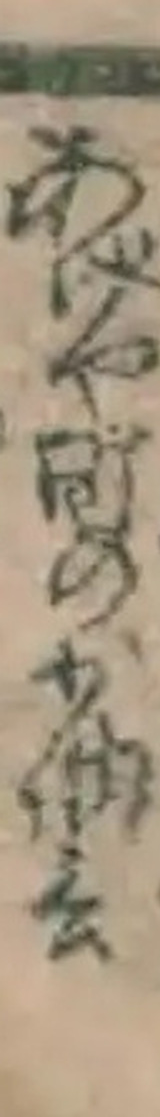あげや町の少納言
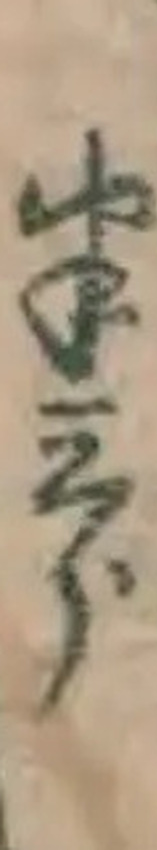半三郎
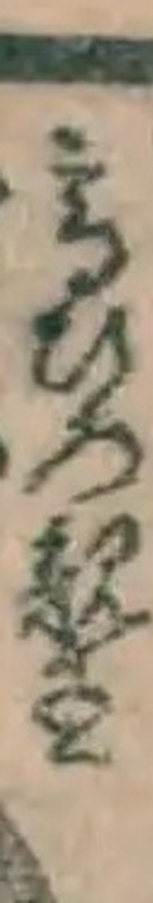高ひろ親王
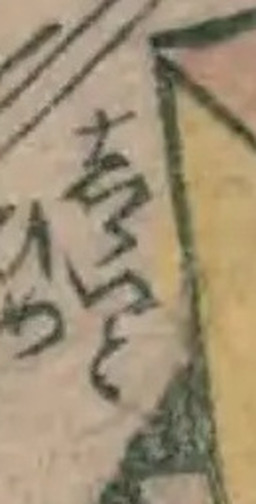しらいと
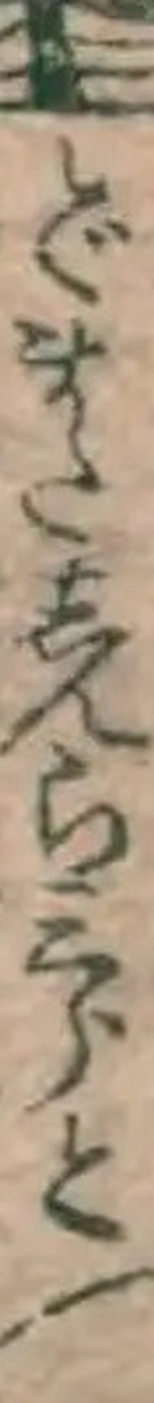どまたしんら三郎と
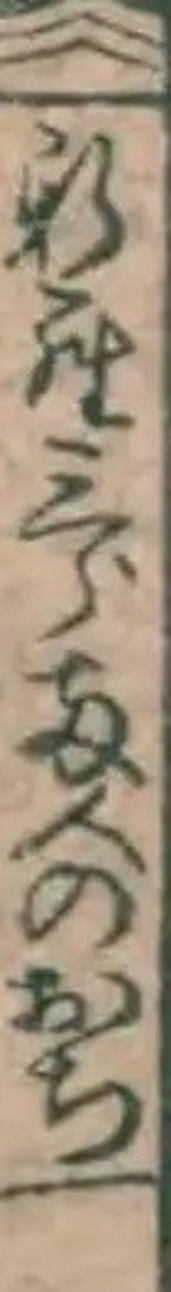新羅三郎両人のおち
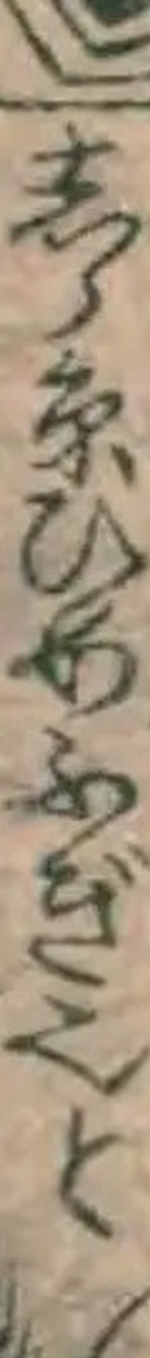しら糸ひめふぎ也と
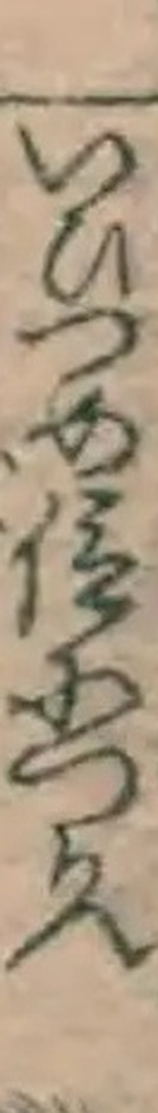いひつめ後につかん
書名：伊達錦對将 : 森田座
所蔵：国立国会図書館 National Diet Library, JAPAN
